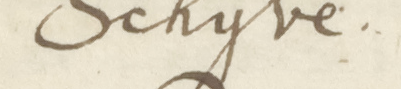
Schijve
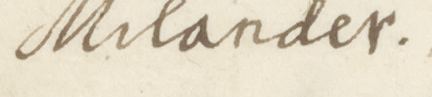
Milander.
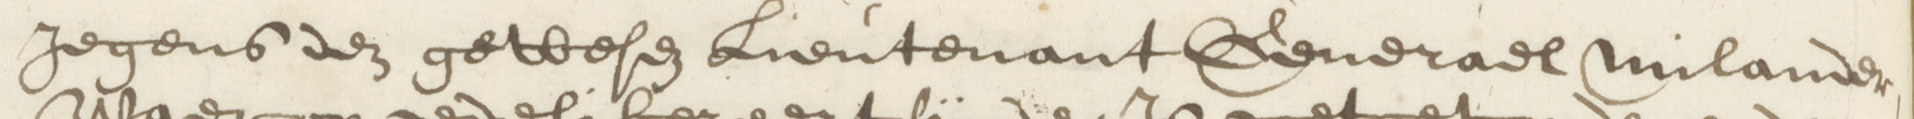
Jegens den gewesen Lieutenant Generael Milander
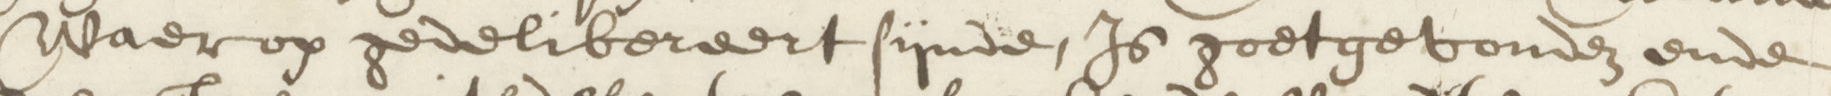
Waerop gedelibereert sijnde, Is goetgevonden ende
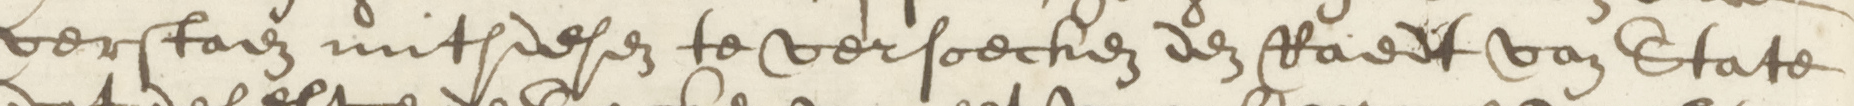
verstaen mitsdesen te versoecken den Raedt van State
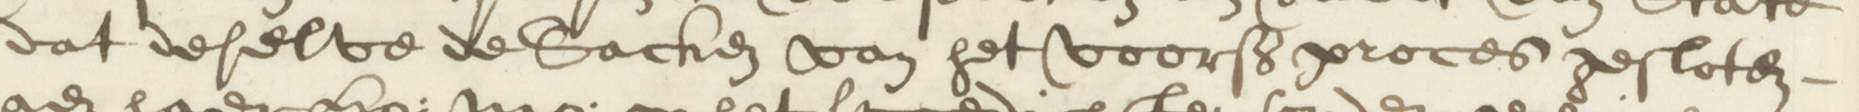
dat deselve de Sacken van het voorsz proces gesloten—
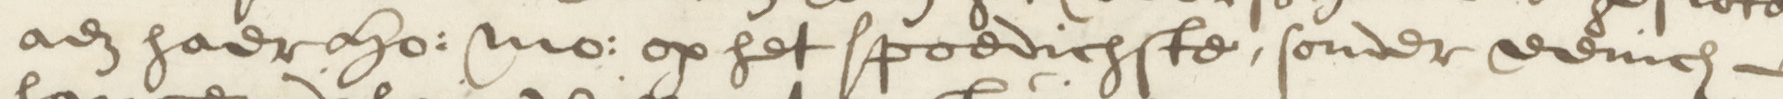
aen haer Ho:Mo: op het spoedichste sonder eenich—
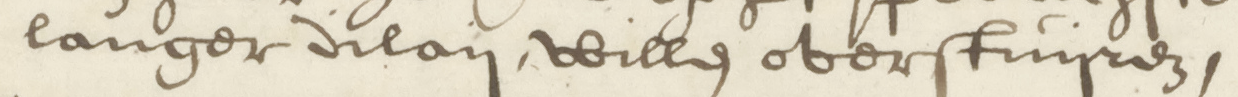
langer dilay, willen overstuijren.
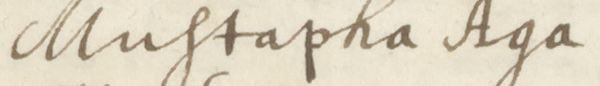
Mustapha Aga
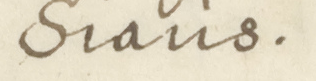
Siaus.
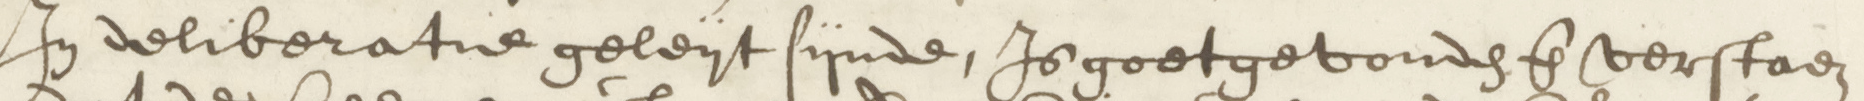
In deliberatie geleijt sijnde, Is goetgevonden & verstaen
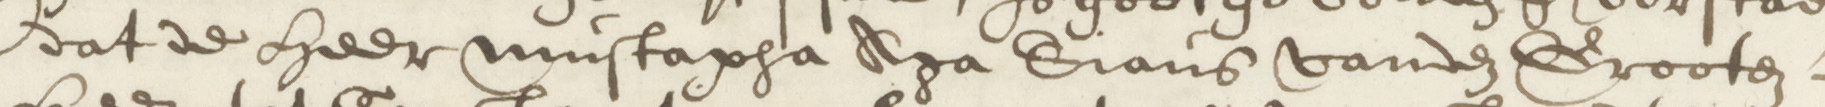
dat de heer Mustapfa Aga Siaus van den Grooten—
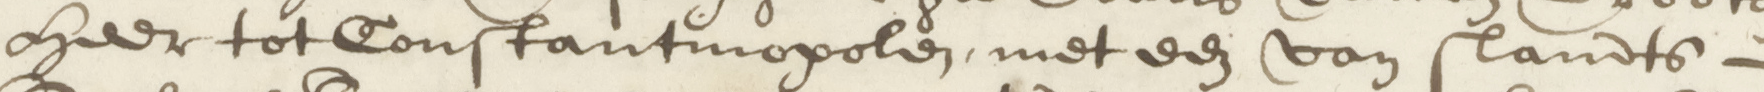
heer tot Constantinopolen met een van slandts—
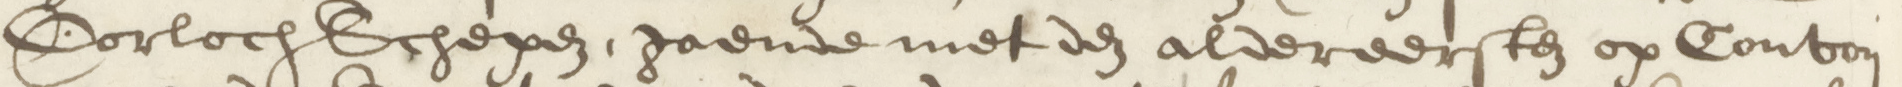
OorlochSchepen, gaende met den aldereersten op Convoy
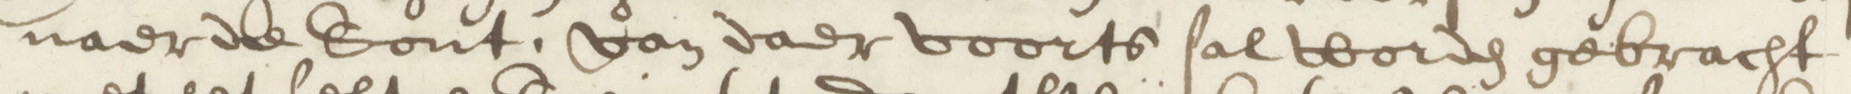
naer de Sont, van daer voorts sal worden gebracht
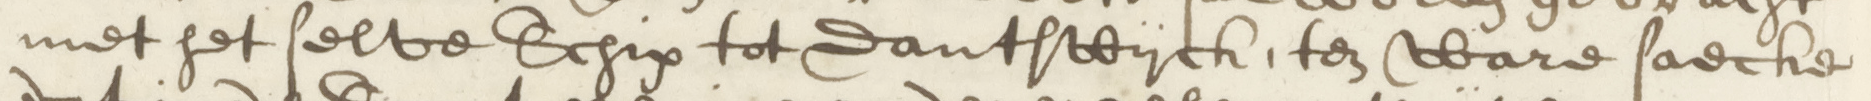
met het selve Schip tot Dantswijck, ten ware saecke
